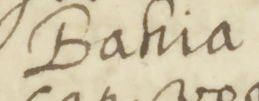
Bahia
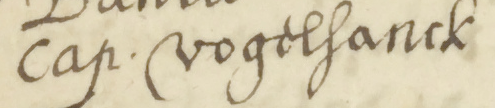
Cap. Vogelsanck
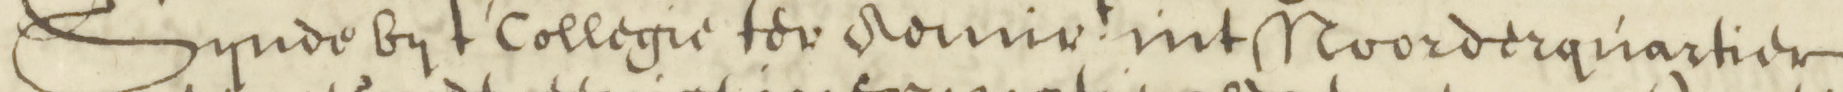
Synde by t‛Collegie ter Admirt. int Noorderquartier
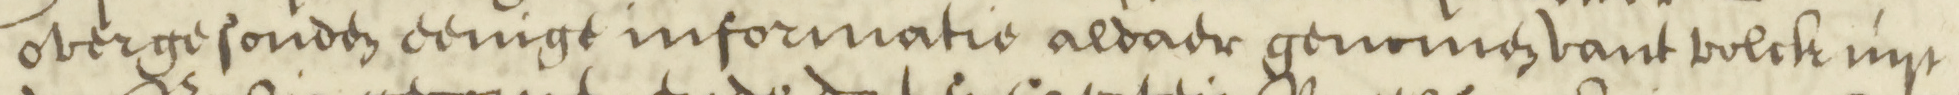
overgesonden eenigt informatie aldaer genomen vant volck uyt
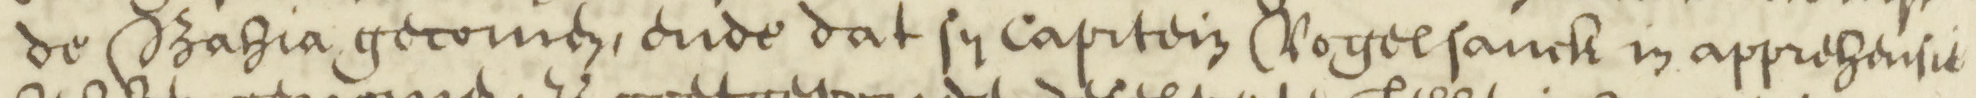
de Bahia gecomen, ende dat sy Capitein Vogelsanck in apprehensie
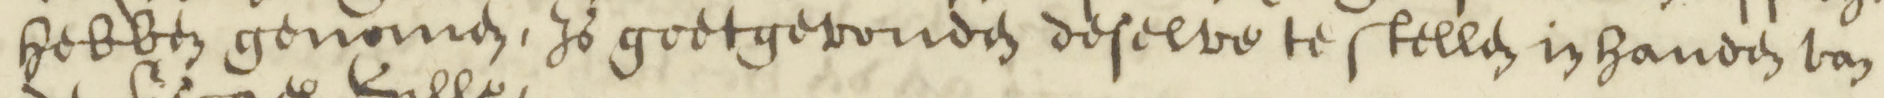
hebben genomen. Is goetgevonden deselve te stellen in handen van
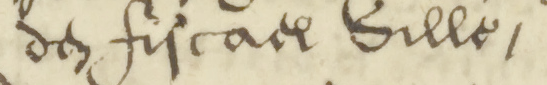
den fiscael Sille.
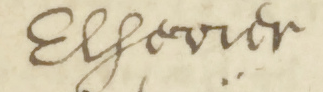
Elsevier
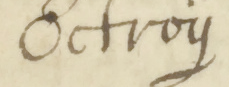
Octroij
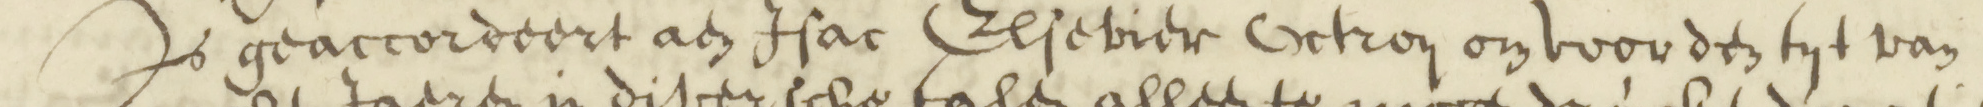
Is geaccordeert aen Isac Elsevier Octroy om voor den tyt van
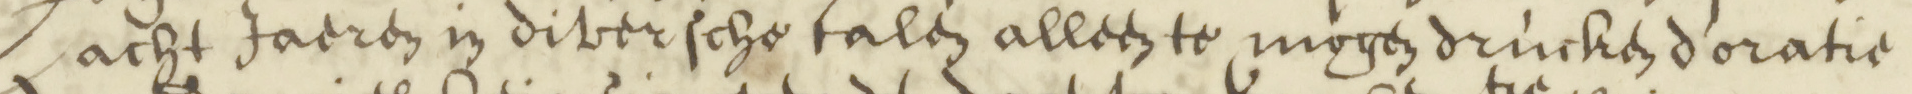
acht Jaeren in diversche talen alleen te mogen drucken d'oratie
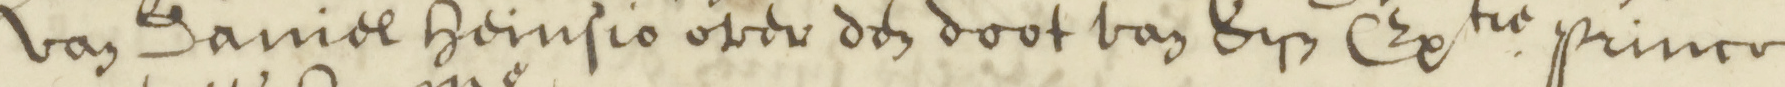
van Daniel heinsio over den doot van Syn Extie. Prince
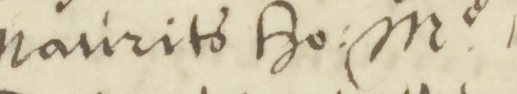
Maurits Ho:Me:
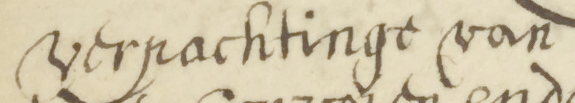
verpachtinge van
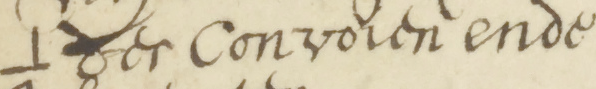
¼ der convoien ende
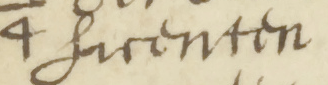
Licenten
